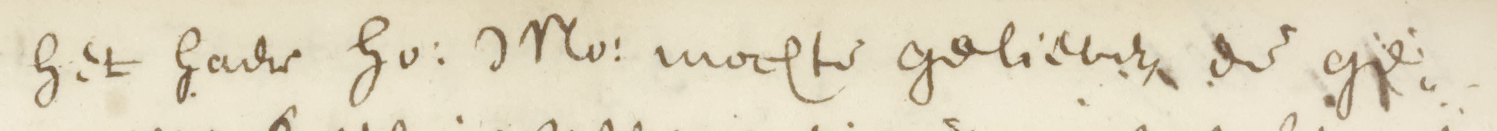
het haer Ho:Mo: mochte gelieven de ge„
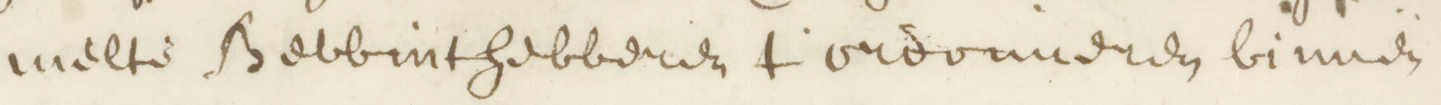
melte Bewinthebberen t'ordonneren binnen
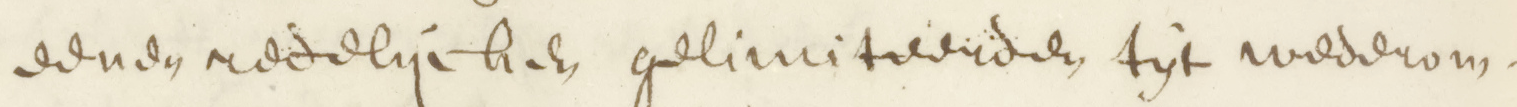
eenen redelijcken gelimiteerden tijt wederom
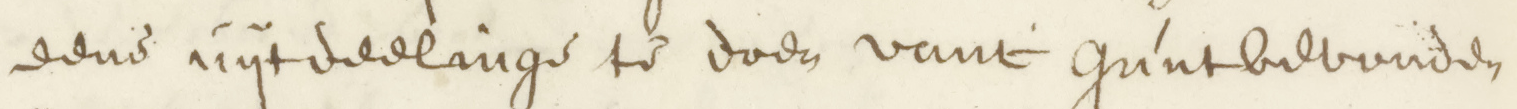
eene uijtdeelinge te doen vant‛ gunt bevonden
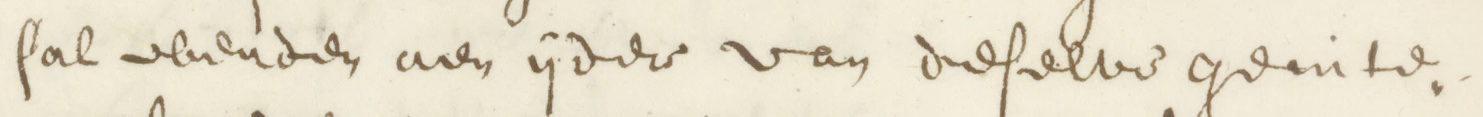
sal werden aen ijder van deselve geinte„
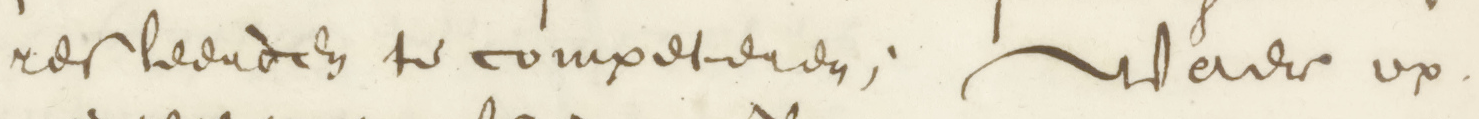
resseerden te competeren; Waer op
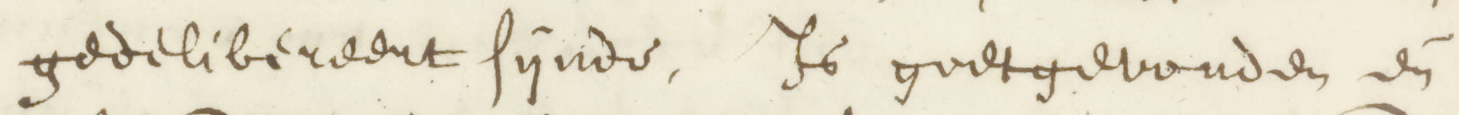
gedelibereert sijnde, Is goetgevonden en
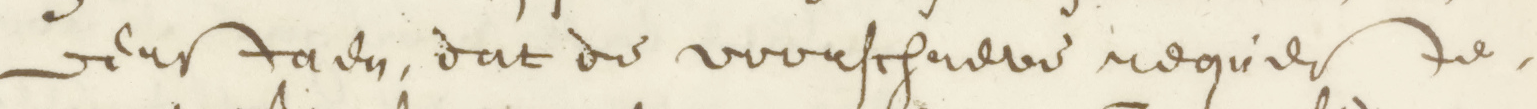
verstaen, dat de voorschreve requeste
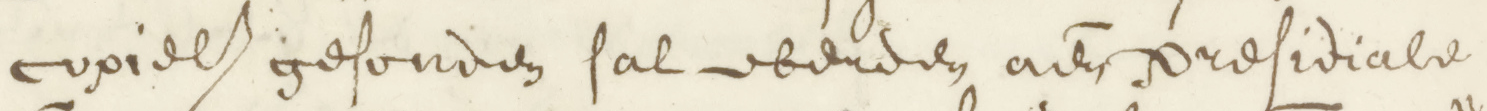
copiel gesonden sal werden aen presidiale
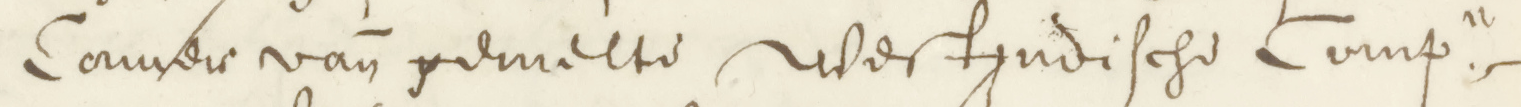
Camer van gemelte Westindische Compe.
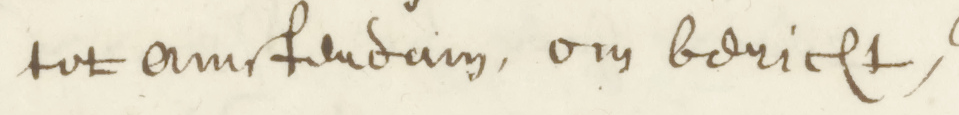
tot Amsterdam, om bericht.
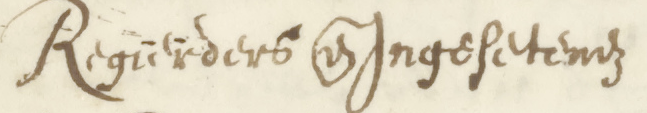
Regierders & Ingesetenen
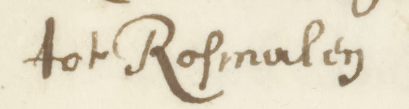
tot Rosmalen
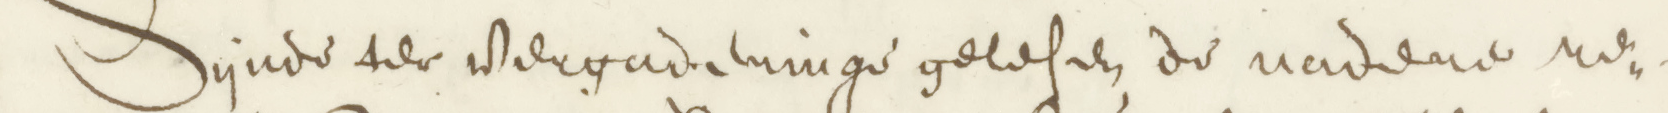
Sijnde ter Vergaderinge gelesen de nadere re„
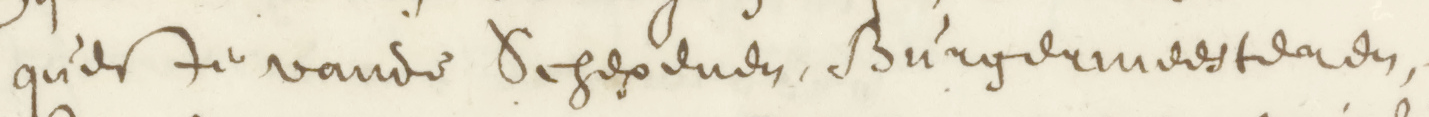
queste vande Schepenen, Burgermeesteren,
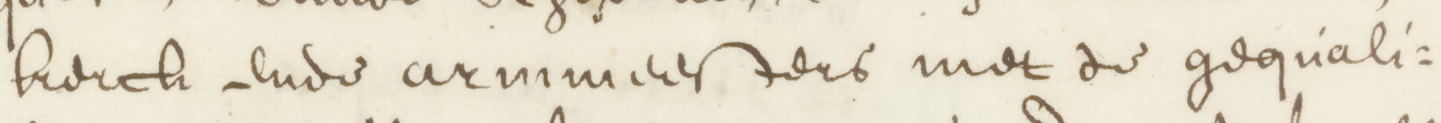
kerck ende armmeesters met de gequali=
